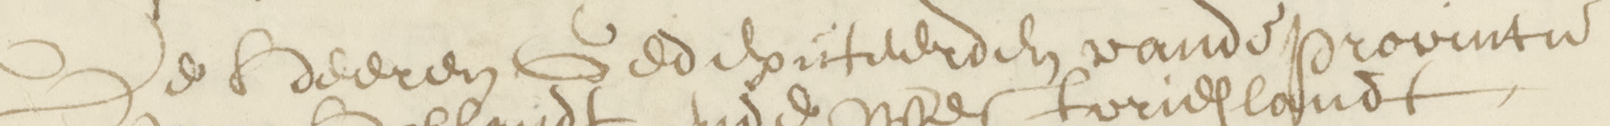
De Heeren Gedeputeerden vande provintie
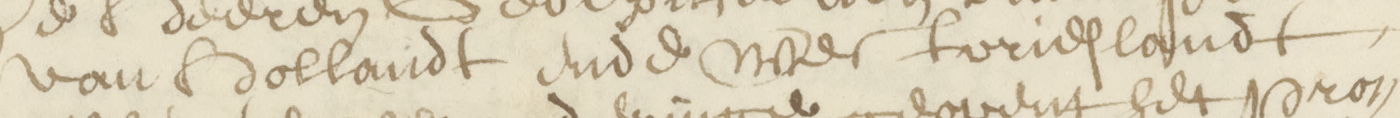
van Hollandt ende Westvrieslandt
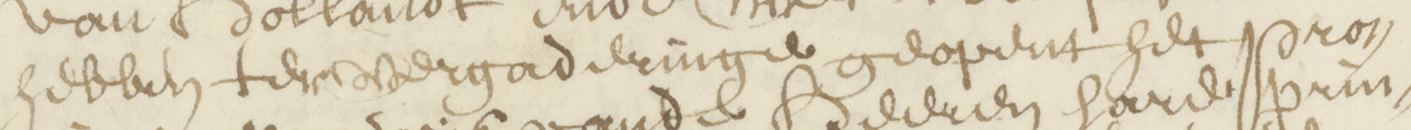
hebben ter vergaderinge geopent het pro„
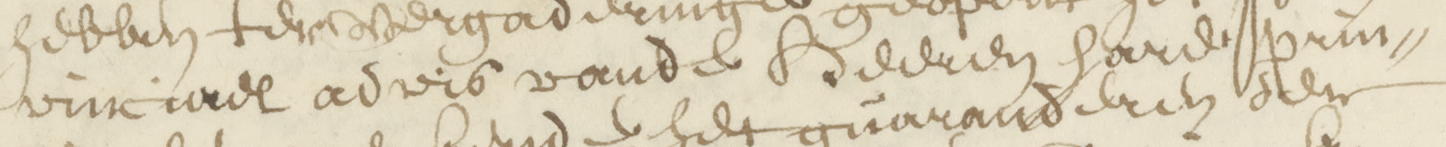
vincael advis vande Heeren hare prin„
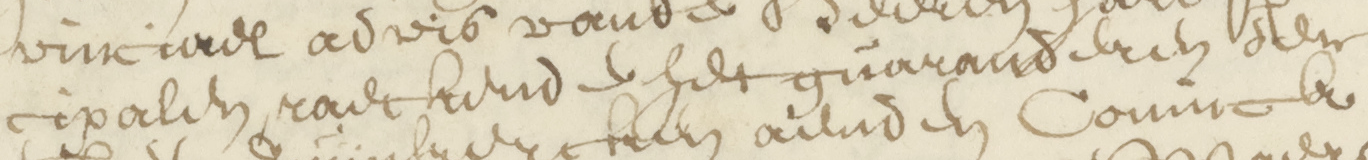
cipalen raeckende het guaranderen der
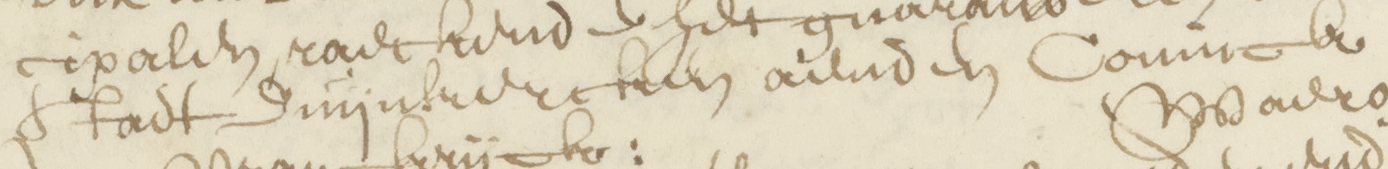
Stadt Duijnkercken aenden Coninck
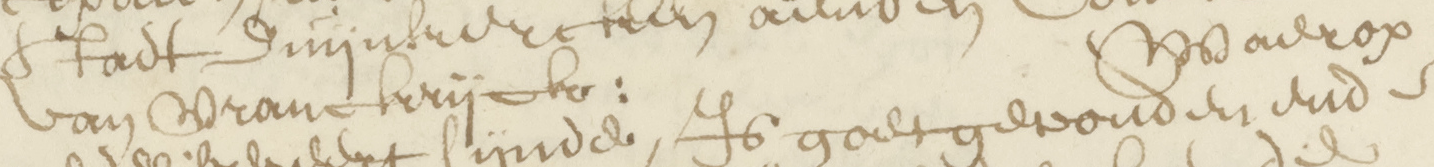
van Vranckrijck: Waerop
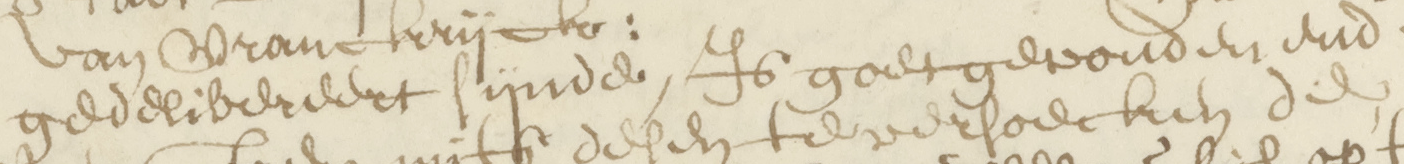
gedelibereert sijnde, Is goetgevonden ende
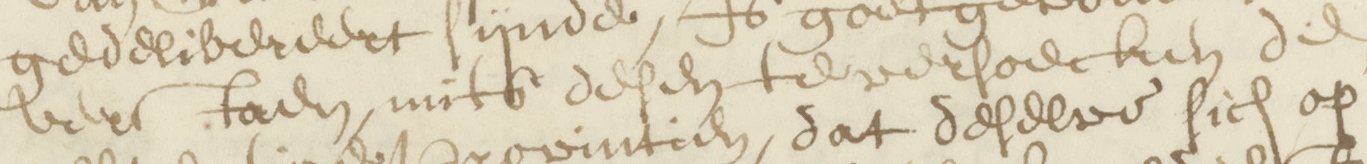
verstaen, mits desen te versoecken de
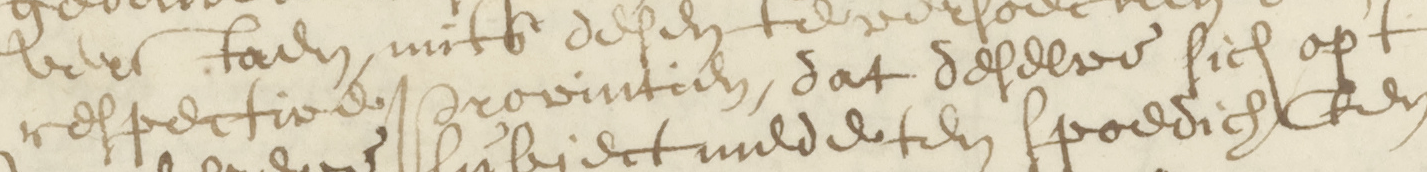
respective Provintien, dat deselve sich op 't
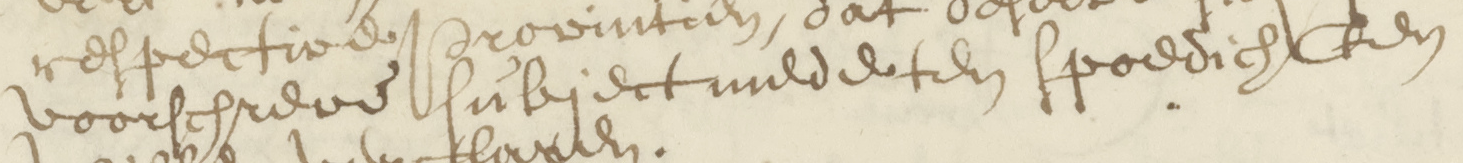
voorschreve subject mede ten spoedichsten
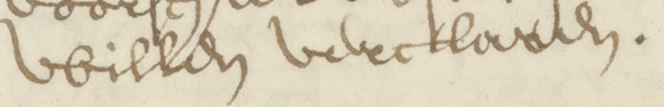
willen verclaren.
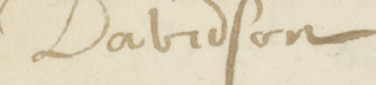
Davidson
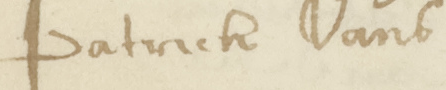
Patrick Vans
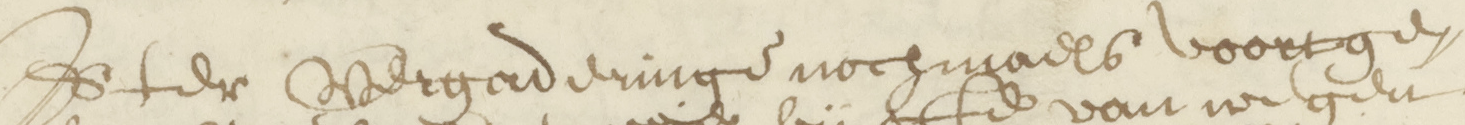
Is ter vergaderinge nochmaels voortge„
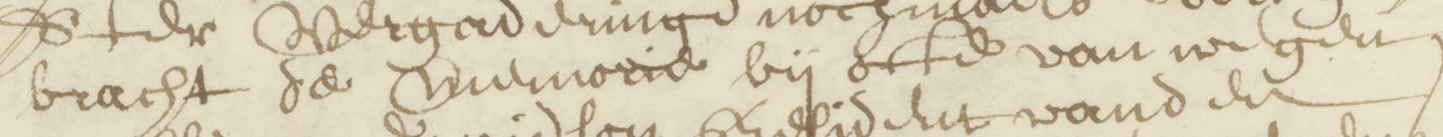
bracht de memorie bij ofte van wegen
